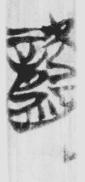{立𡴎欠臼}
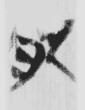肥
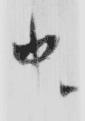中
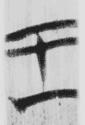王
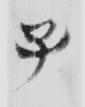子
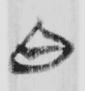白
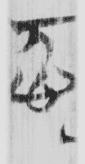{元心}
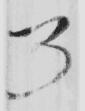乃
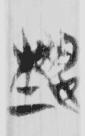埶
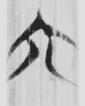六
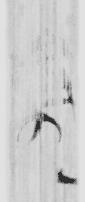甫
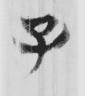子
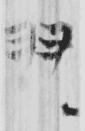羽
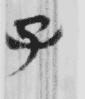子
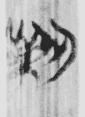剌
